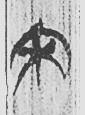宋
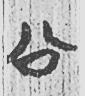公
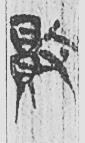敗
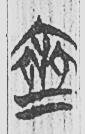齊
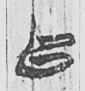𠂤
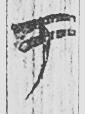于
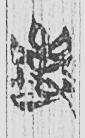襄
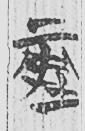坪
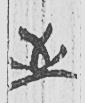至
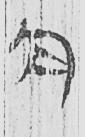今
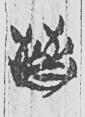晉
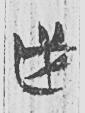戉
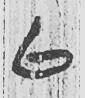㠯（以）
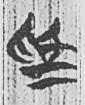爲
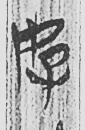好
